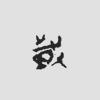歲
